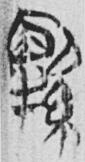繲（解）
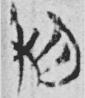利
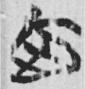西
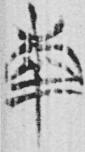南
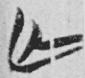亡（无）
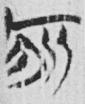所
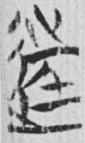○（往）
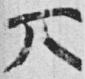亓（其）
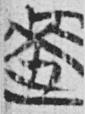○（來）
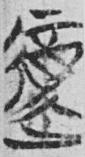○（復）
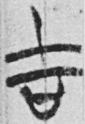吉
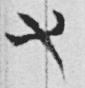又（有）
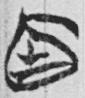○（攸）
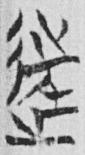○（往）
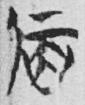宿
